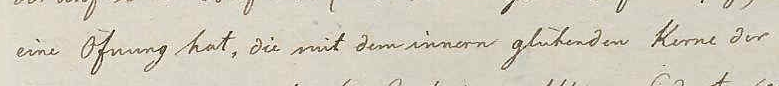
eine Öfnung hat, die mit dem innern glühenden Kerne der
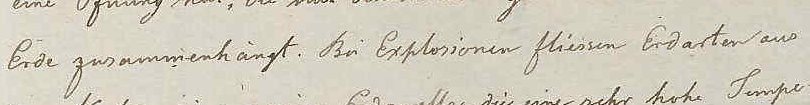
Erde zusammenhängt. Bei Explosionen fliessen Erdarten aus
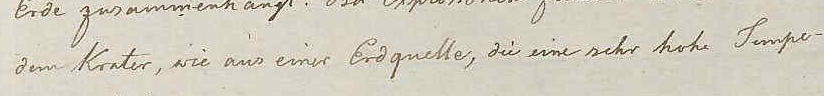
dem Krater, wie aus einer Erdquelle, die eine sehr hohe Tempe-
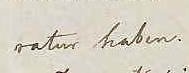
ratur haben.
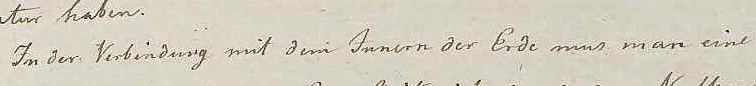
In der Verbindung mit dem Innern der Erde mus man eine
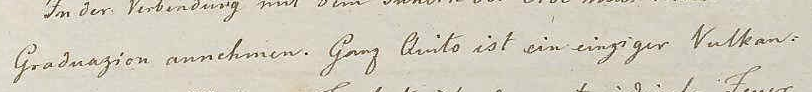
Graduazion annehmen. Ganz Quito ist ein einziger Vulkan:
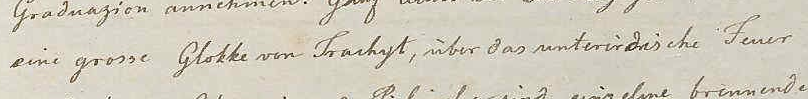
eine grosse Glokke von Trachyt, über das unterirdische Feuer
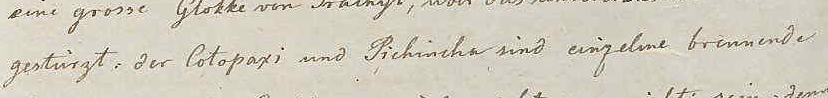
gestürzt: der Cotopaxi und Pichincha sind einzelne brennende
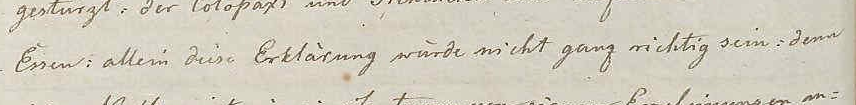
Essen: allein diese Erklärung würde nicht ganz richtig sein: denn
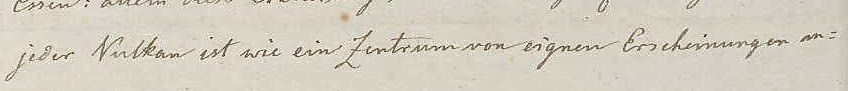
jeder Vulkan ist wie ein Zentrum von eignen Erscheinungen an-
